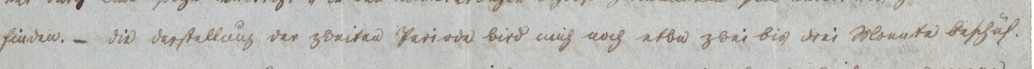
finden. – Die Darstellung der zweiten Periode wird mich noch etwa zwei bis drei Monate beschäf-
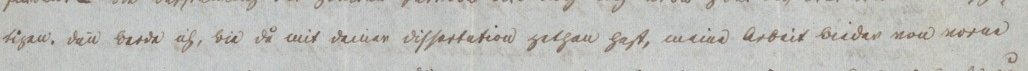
tigen. Dann werde ich, wie du mit deiner Dissertation gethan hast, meine Arbeit wieder von vorne
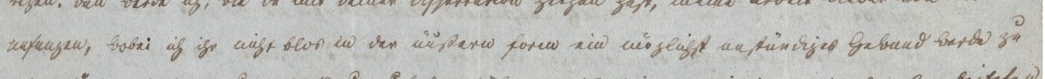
anfangen, wobei ich ihr nicht blos in der äußern Form ein möglichst anständiges Gewand werde zu
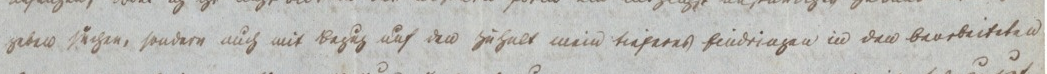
geben suchen, sondern auch mit Bezug auf den Gehalt mein tieferes Eindringen in den bearbeiteten
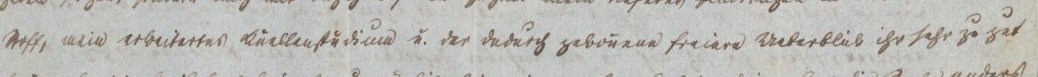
Stoff, mein erweitertes Quellenstudium u. der dadurch gewonnene freiere Ueberblick ihr sehr zu gut
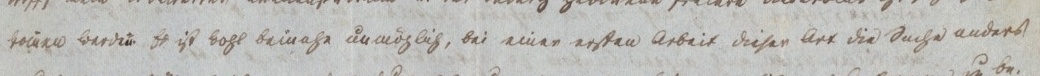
kommen werden. Es ist wohl beinahe unmöglich, bei einer ersten Arbeit dieser Art die Sache anders
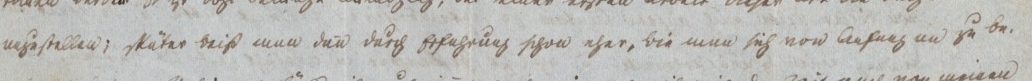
anzustellen; später weiß man dann durch Erfahrung schon eher, wie man sich von Anfang an zu be-
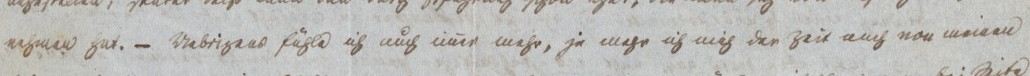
nehmen hat. – Uebrigens fühle ich auch immer mehr, wie sehr ich mich der Zeit nach von meinen
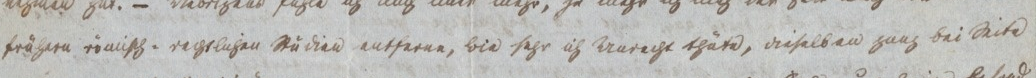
frühern römisch-rechtlichen Studien entferne, wie sehr ich Unrecht thäte, dieselben ganz bei Seite
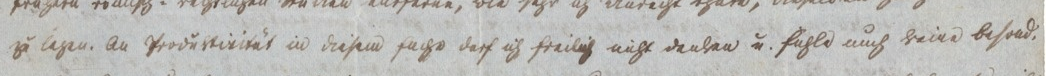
zu legen. An Produktivität in diesem Fache darf ich freilich nicht denken u. fühle auch keine besond-
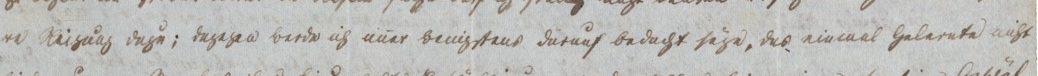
re Neigung dazu; dagegen werde ich immer wenigstens darauf bedacht seyn, das einmal Gelernte nicht
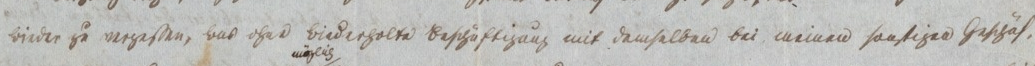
wieder zu vergessen, was ohne wiederholte Beschäftigung mit demselben bei meinen sonstigen Geschäf-
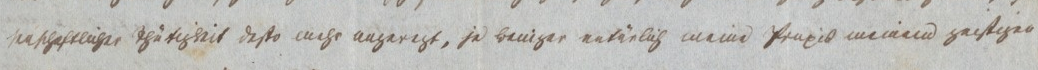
senschaftlicher Thätigkeit desto mehr angeregt, je weniger natürlich meine Praxis meinem geistigen
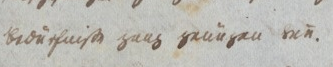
Bedürfnisse ganz genügen kann.
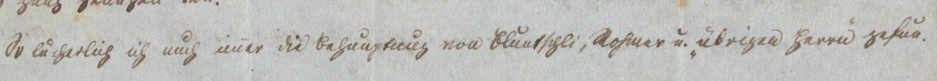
So lächerlich ich auch immer die Behauptung von Bluntschli, Rohmer u. «übrigen Herren» gefun-
